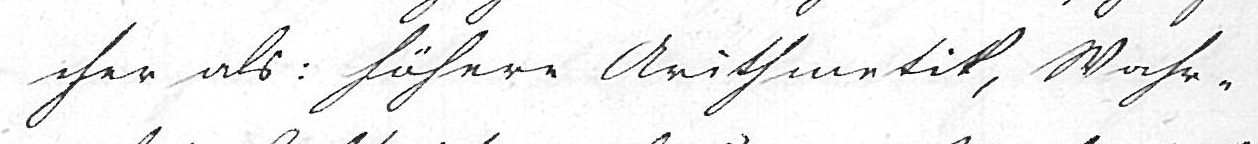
cher als höhere Arithmetik, Wahr-
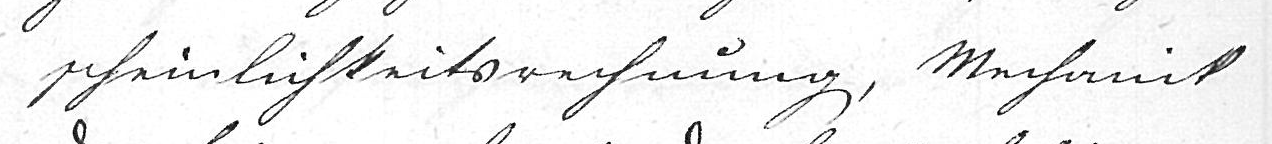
scheinlichkeitsrechnng, Mechanik
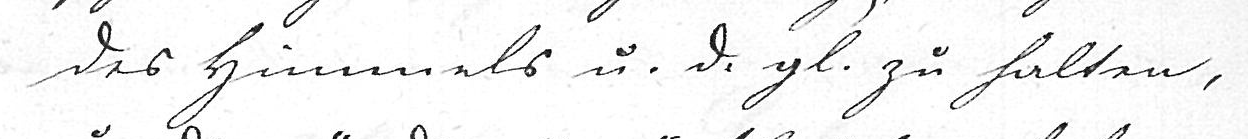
des Himmels u. d. gl. zu halten,
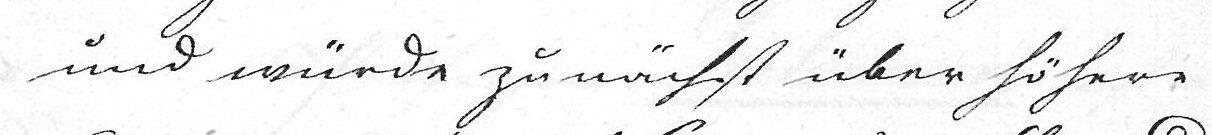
und würde zunächst über höhere
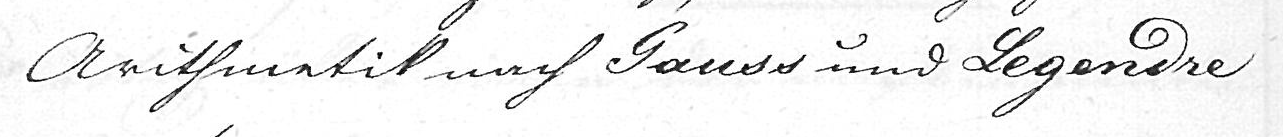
Arithmetik nach Gauss und Legendre
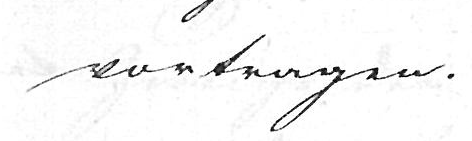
vortragen.
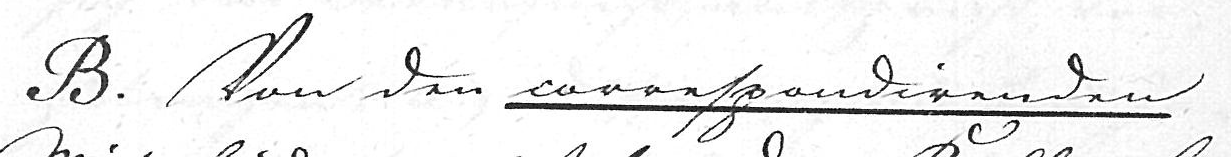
B. Von den correspondirenden
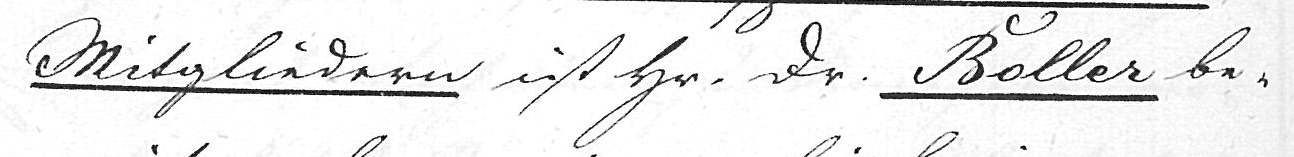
Mitgliedern ist Hr. Dr. Boller be-
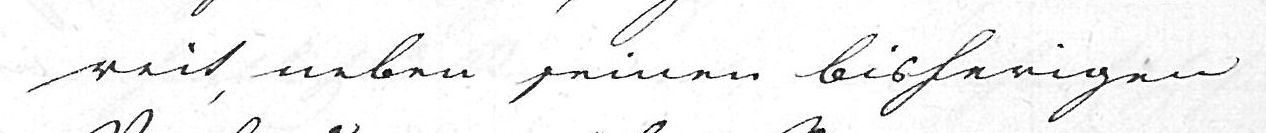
reit, neben seinen bisherigen
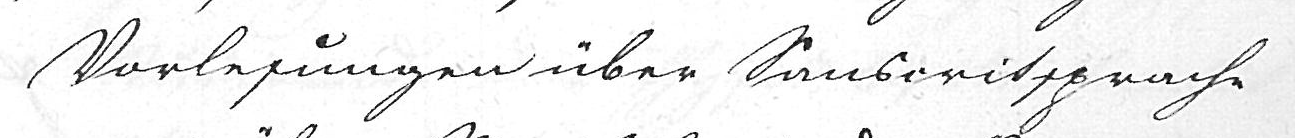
Vorlesungen über Sanscritsprache
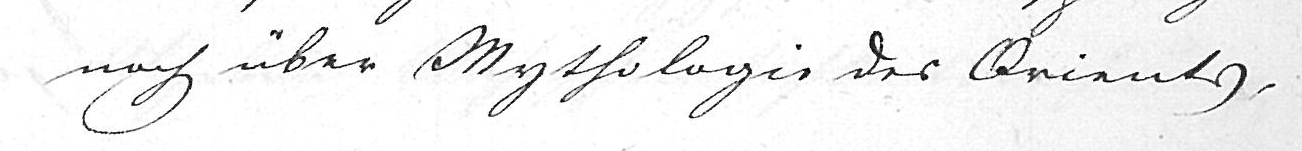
noch über Mythologie des Orients,
